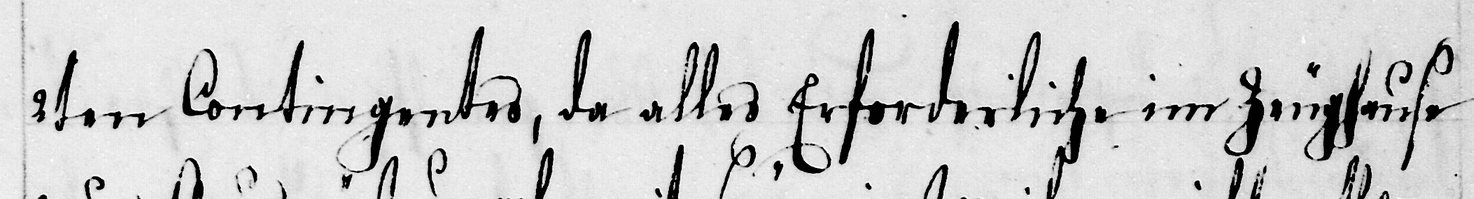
2ten Contingentes, da alles Erforderliche im Zeughause
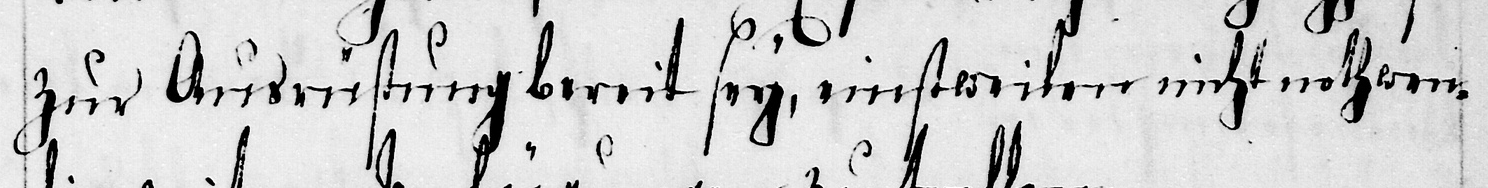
zur Ausrüstung bereit sey, einstweilen nicht nothwen¬
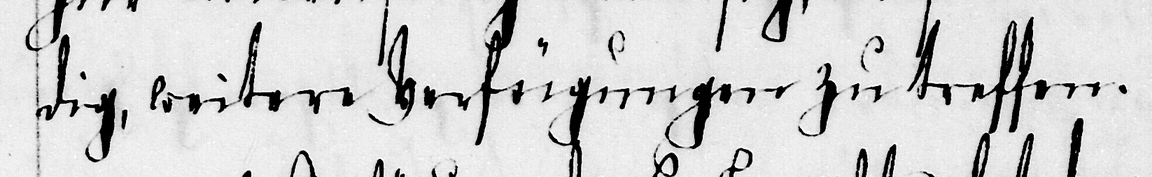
dig, weitere Verfügungen zu treffen.
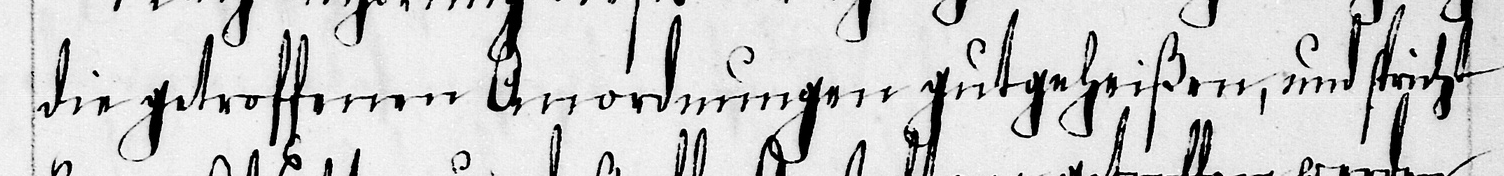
die getroffenen Anordnungen gutgeheißen, und spricht
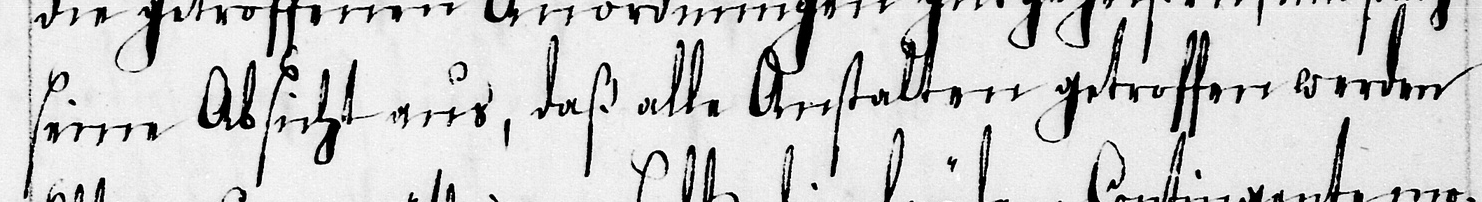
seine Absicht aus, daß alle Anstalten getroffen werden
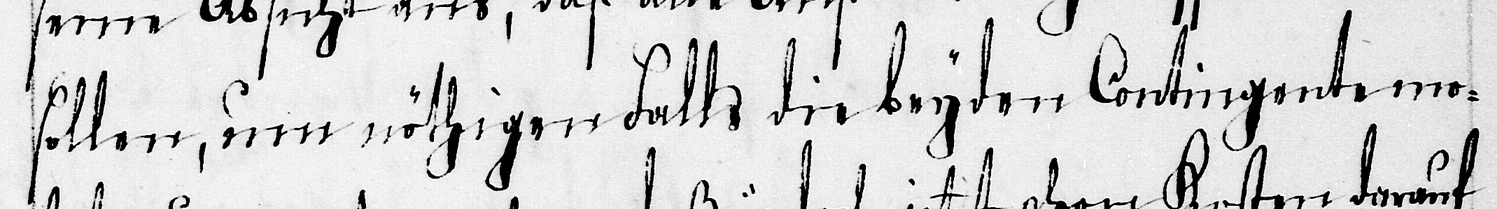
sollen, um nöthigen Falls die beyden Contingente mo¬
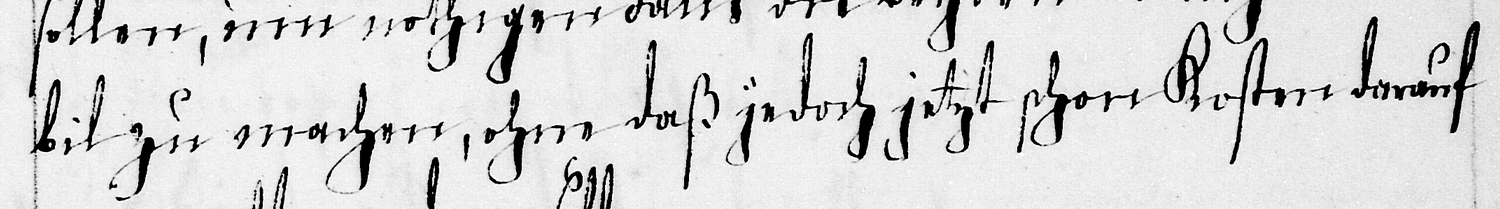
bil zu machen, ohne daß jedoch jetzt schon Kosten darauf
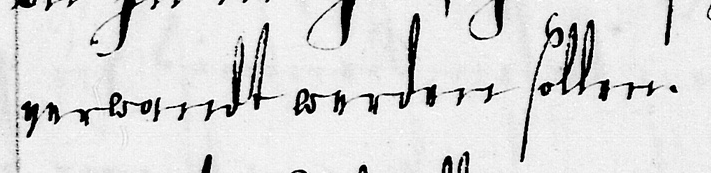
verwandt werden sollen.
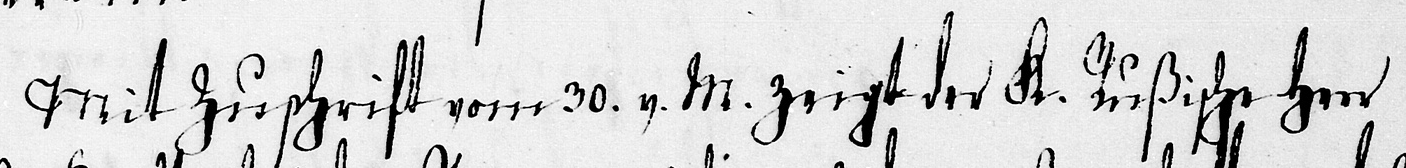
Mit Zuschrift vom 30. v. M. zeigt der K. Rußische Herr
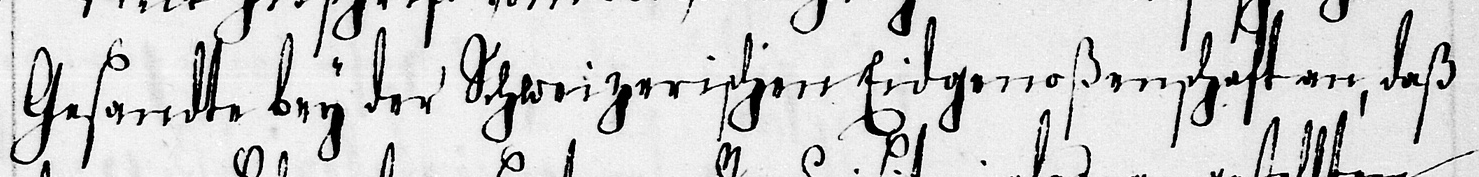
Gesandte bey der Schweizerischen Eidgenoßenschaft an, daß
